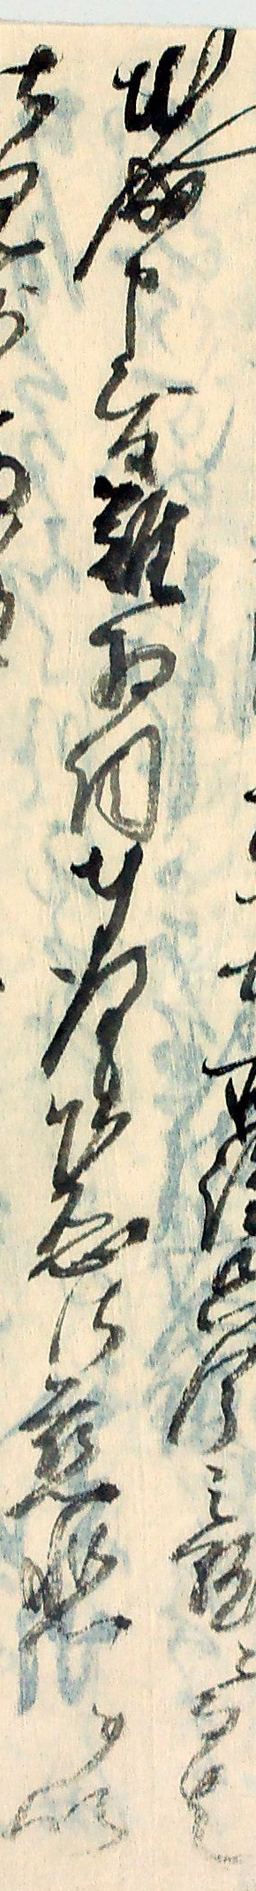地成申度難相調奉存候乍恐御慈悲を以
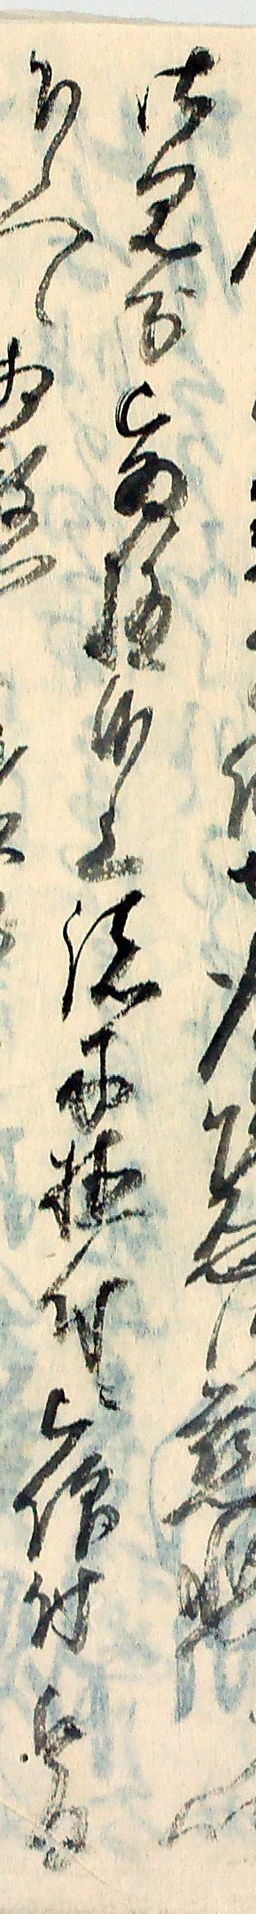御見分被為遊候上諸木植付に被仰付被為
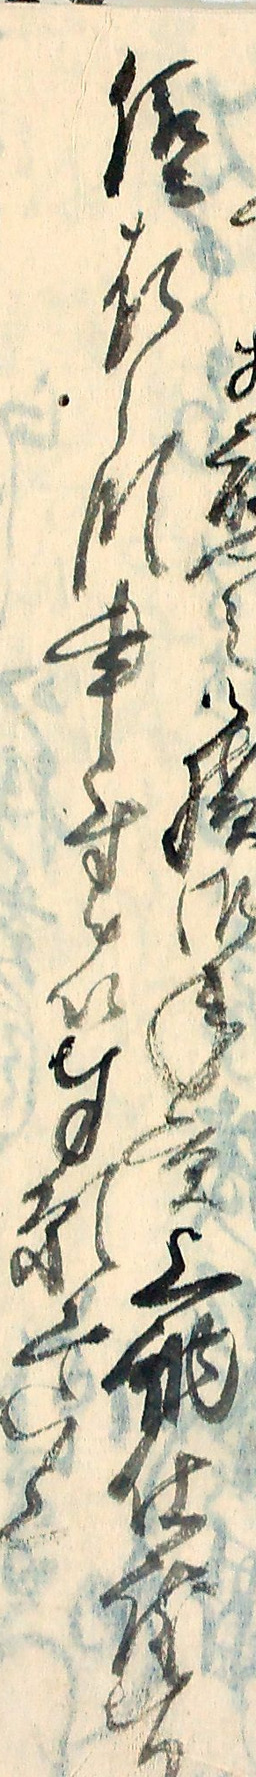依て右之段書付を以て奉願上候以上
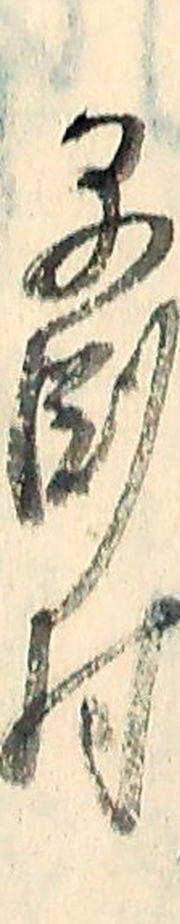早淵村
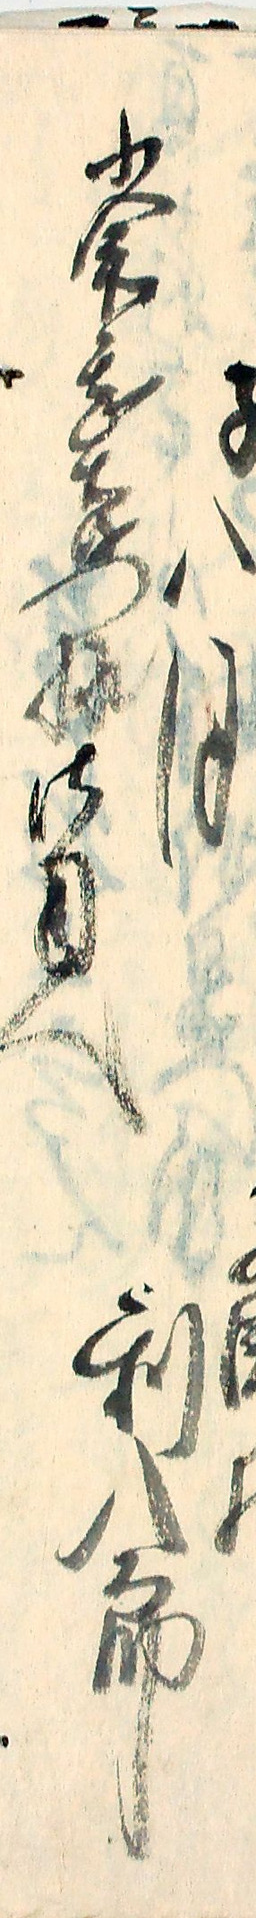小倉甚右衛門様御用人
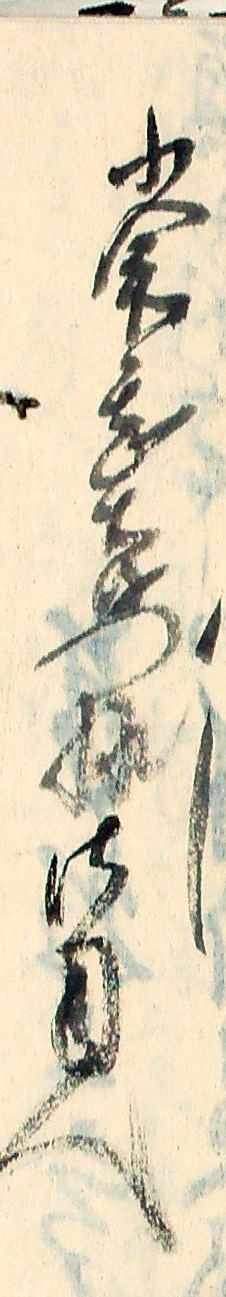小倉甚右衛門様御用人

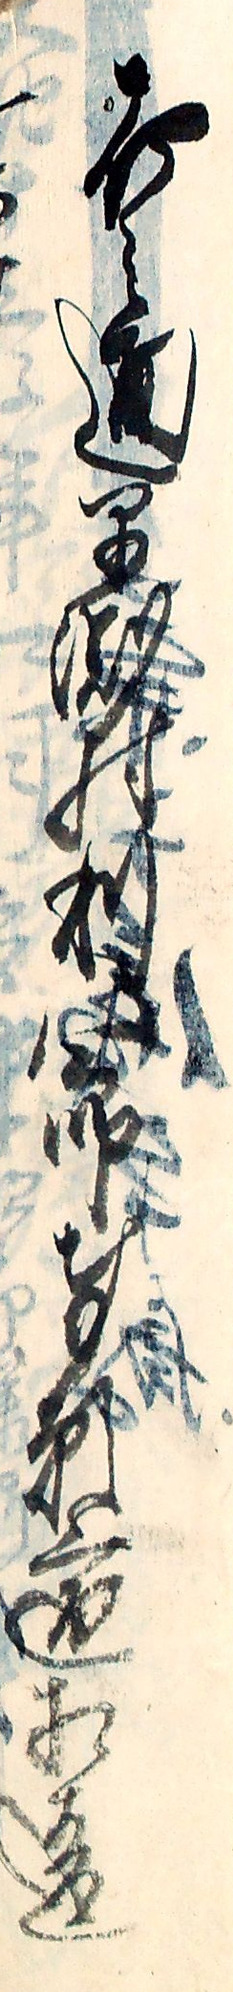右之通早淵村利八郎奉願上通相違
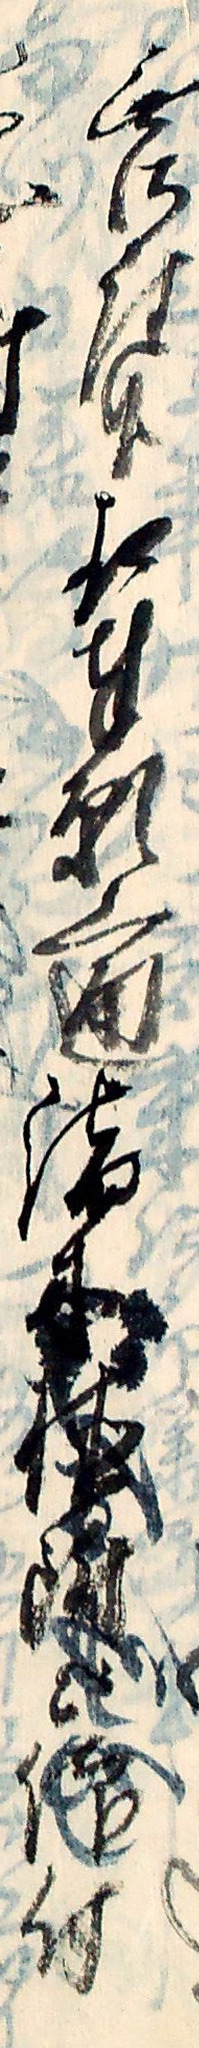無御座候右奉願上通諸木植附被仰付
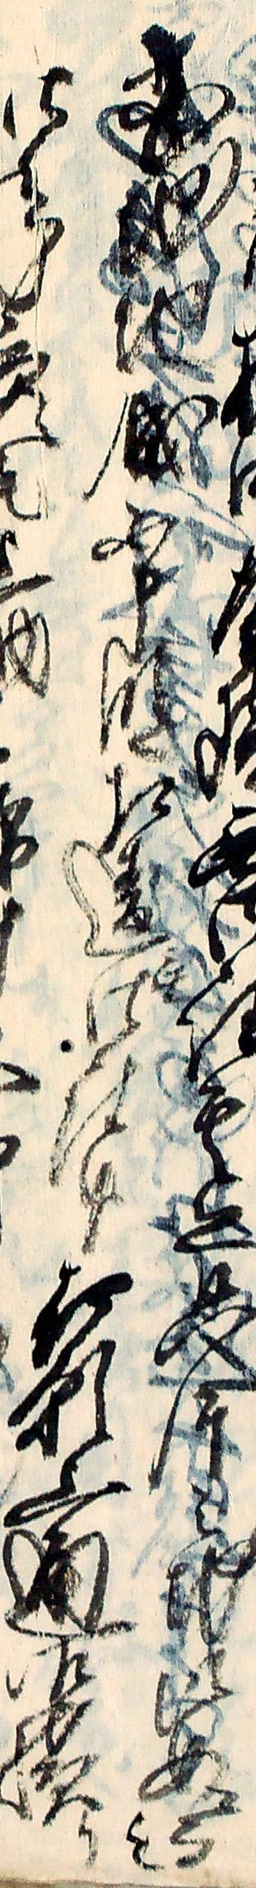或肥地成不申段相違無御座候右願上通御積り
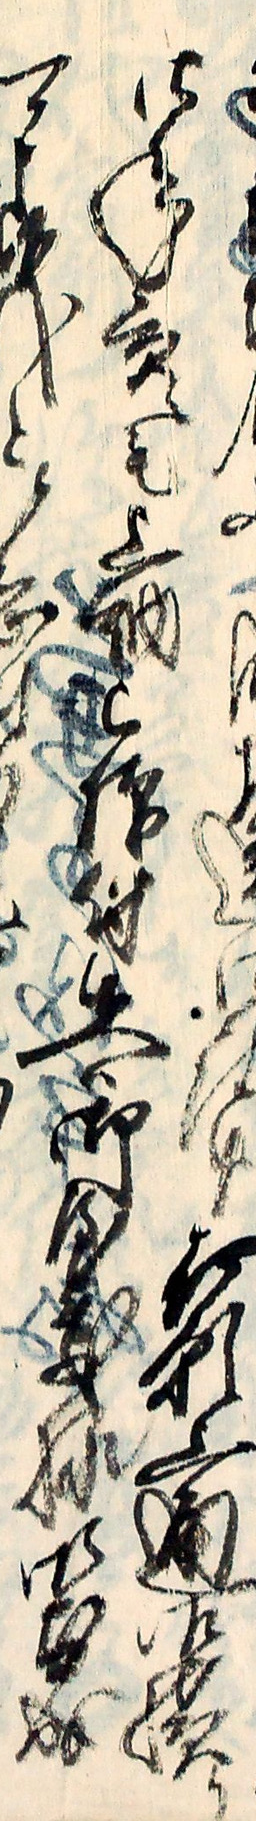御年貢にも上納被仰付先は御屋敷様御知成
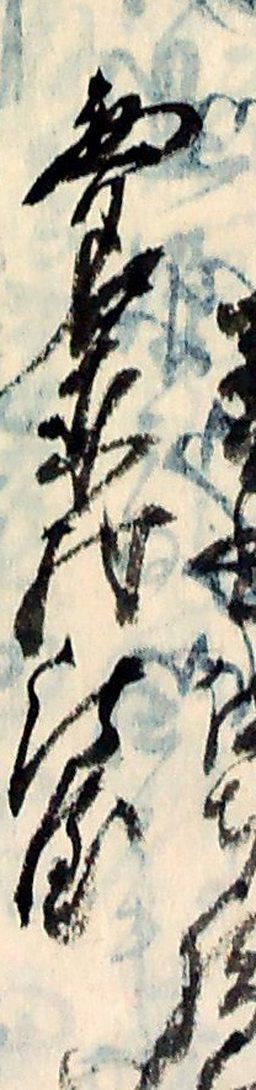西名東村庄屋
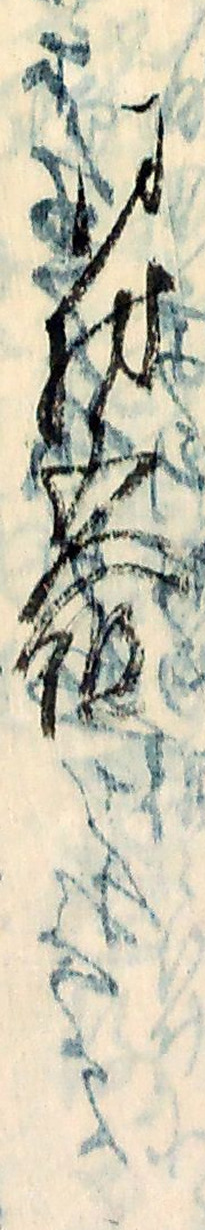同村五人組
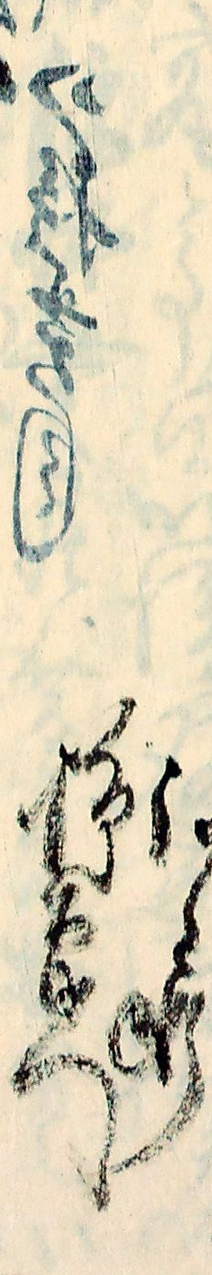忬右衛門

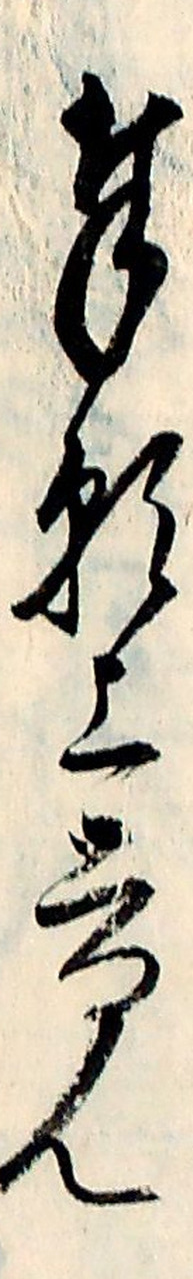奉願上覚
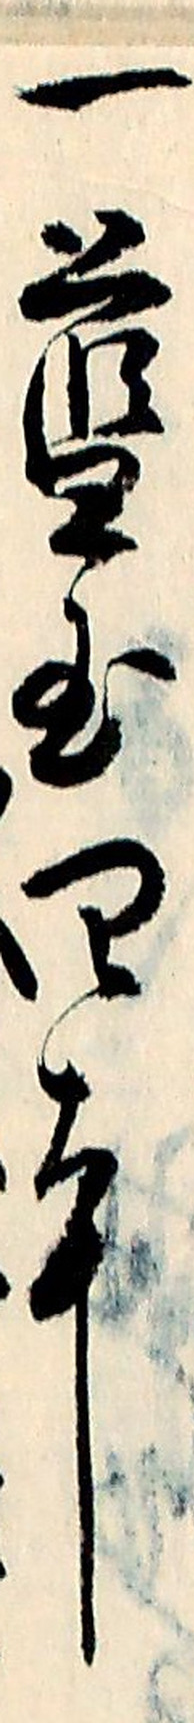一藍玉四本
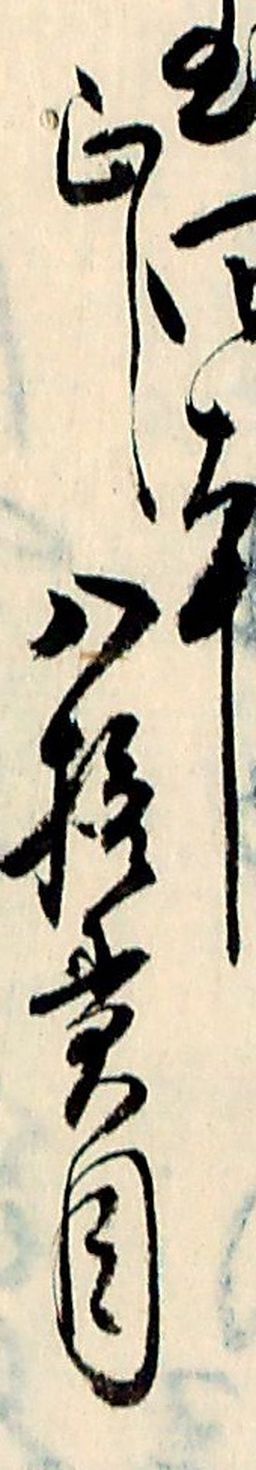正八拾貫目
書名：諸御願書控(後藤氏壱番）
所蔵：鳴門教育大学 Naruto University of Education
